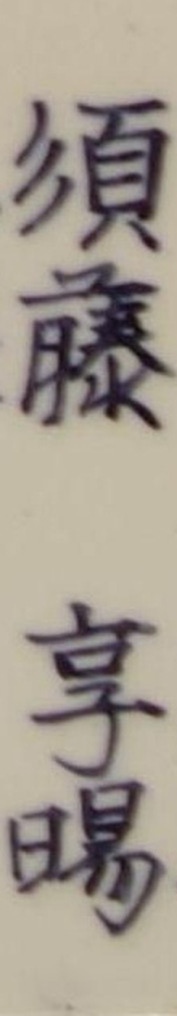須藤享暘
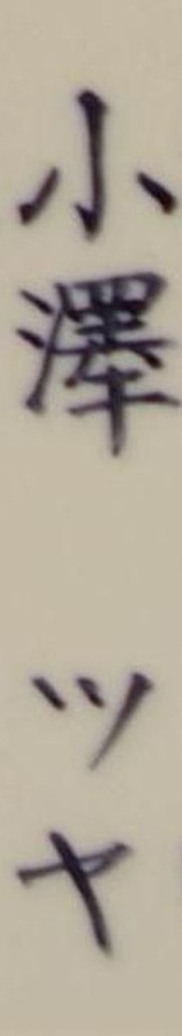小澤ツヤ
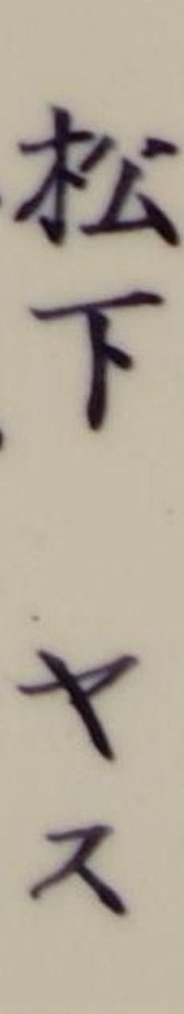松下ヤス
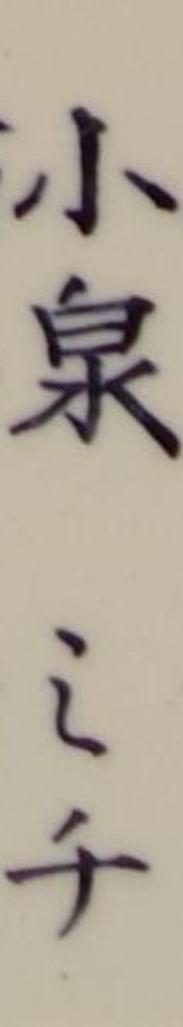小泉ミチ
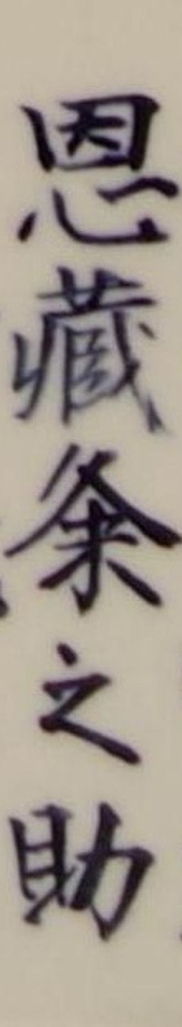恩蔵粂之助
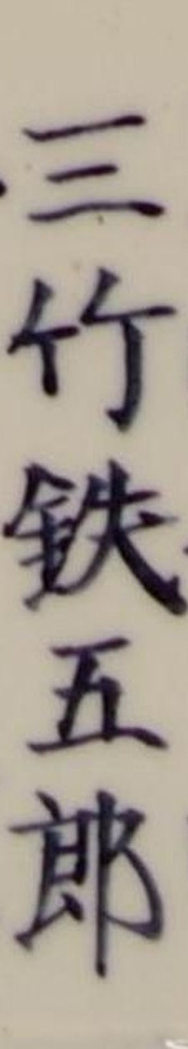三竹鉄五郎
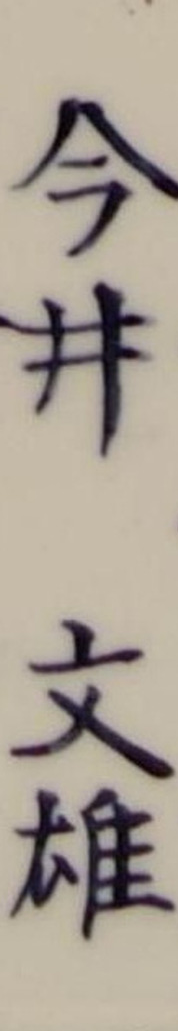今井文雄
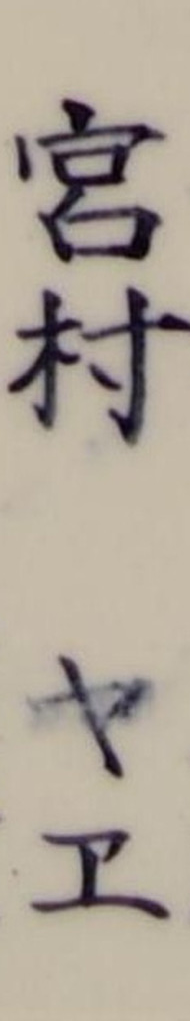宮村ヤエ
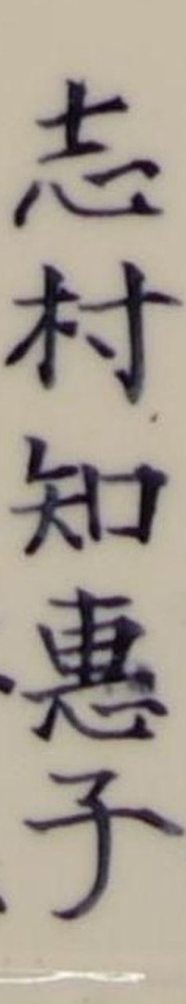志村知恵子
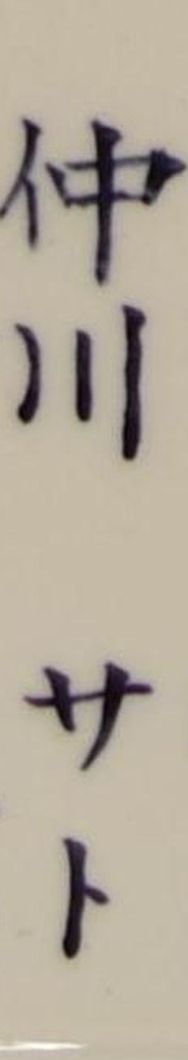仲川サト
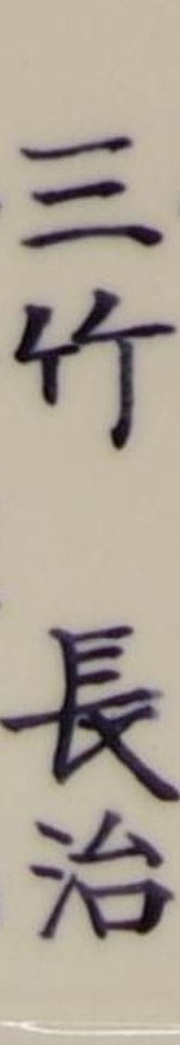三竹長治
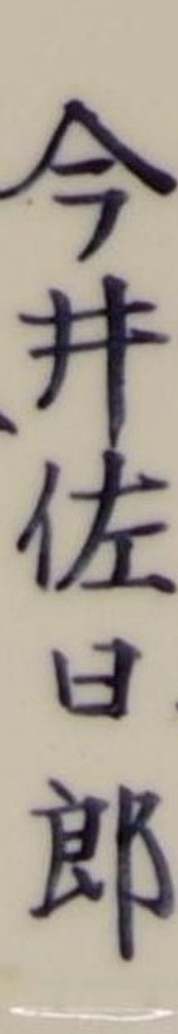今井佐日郎
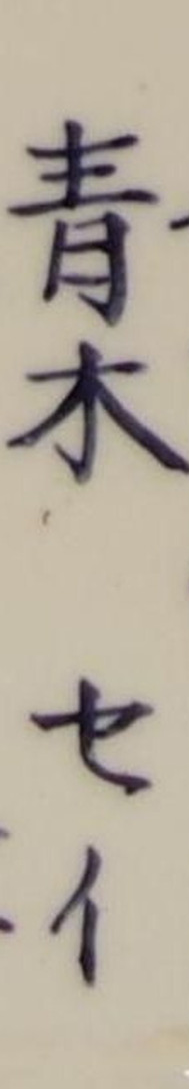青木セイ
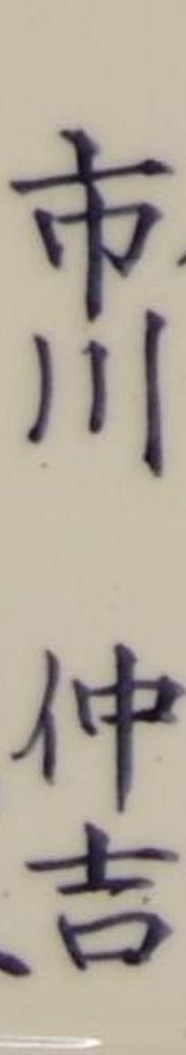市川仲吉
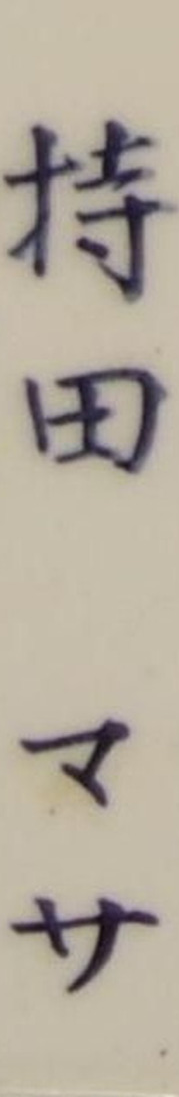持田マサ
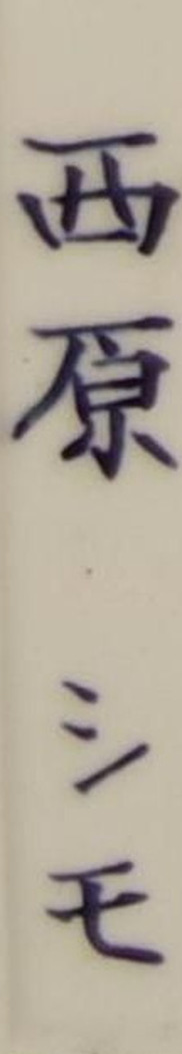西原シモ
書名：M~S
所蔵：高野山金剛峯寺
